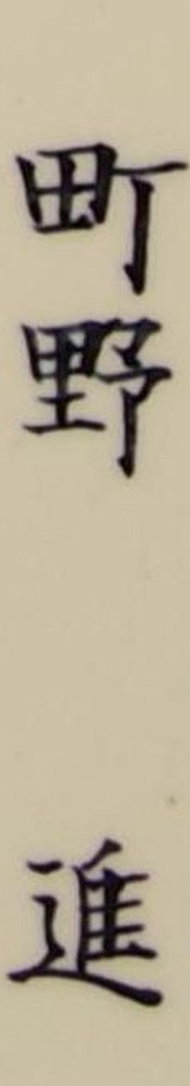町野進
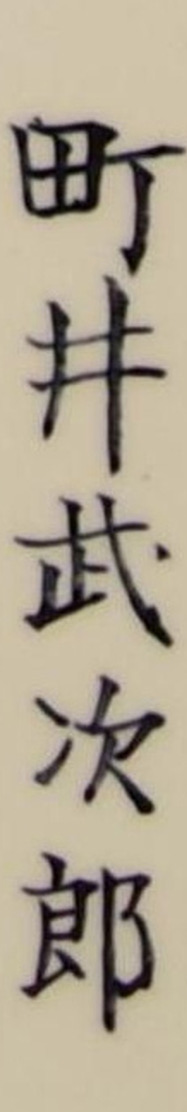町井武次郎
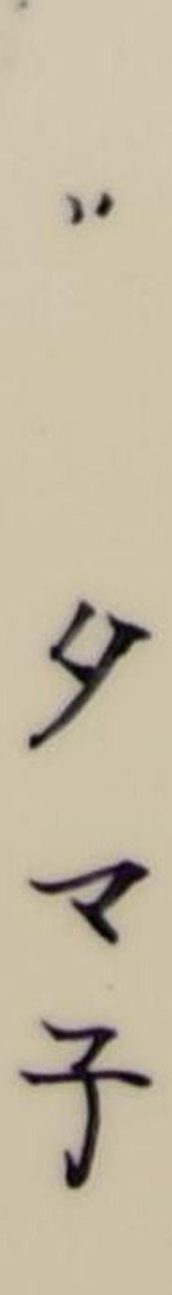タマ子
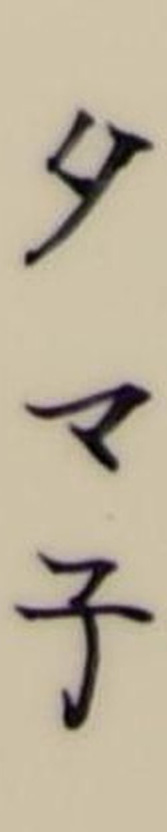タマ子
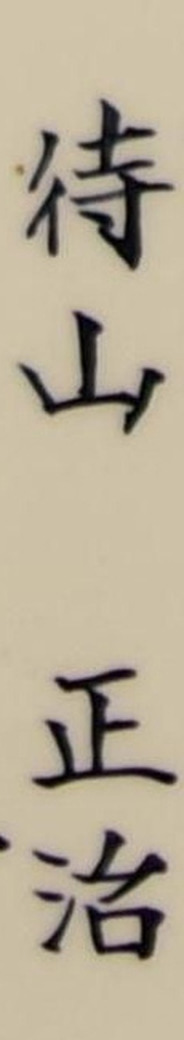待山正治
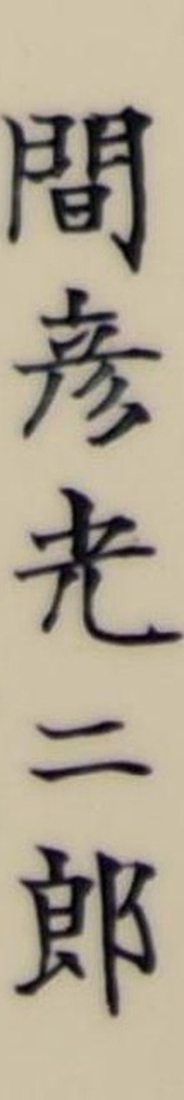間彦光二郎
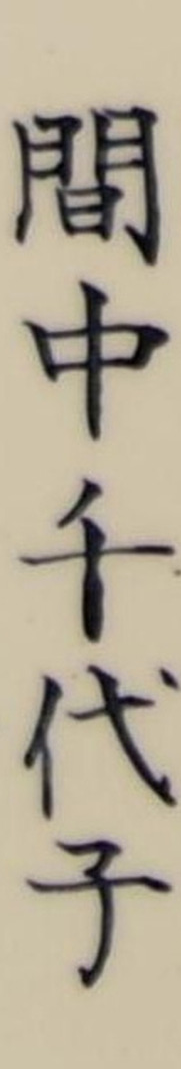間中千代子
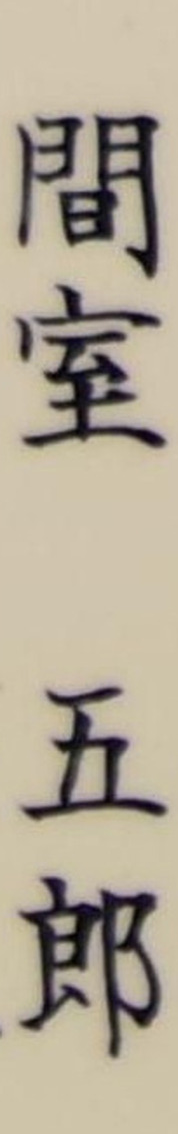間室五郎
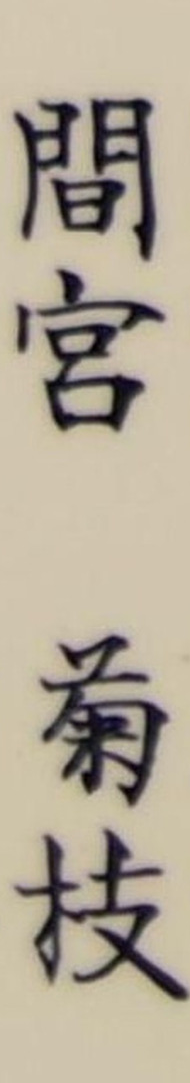間宮菊枝
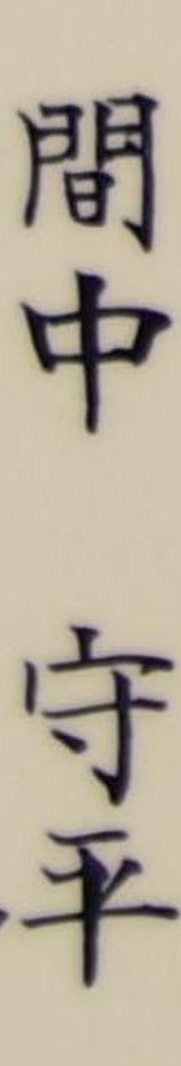間中守平
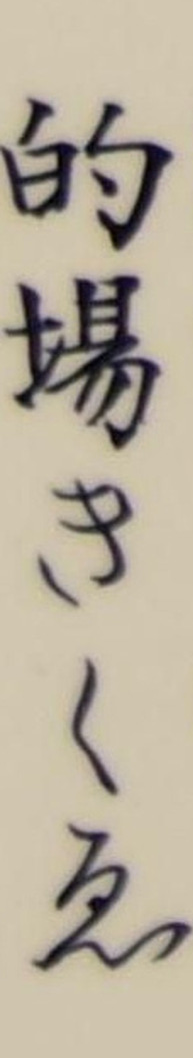的場きくゑ
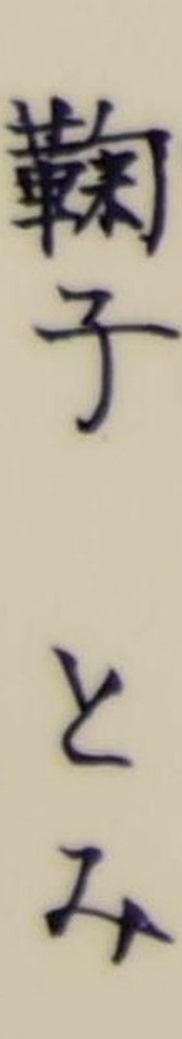鞠子とみ
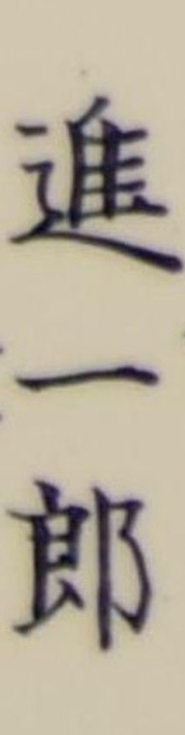進一郎
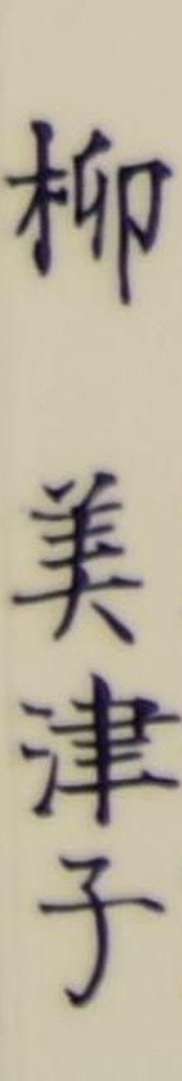柳美津子

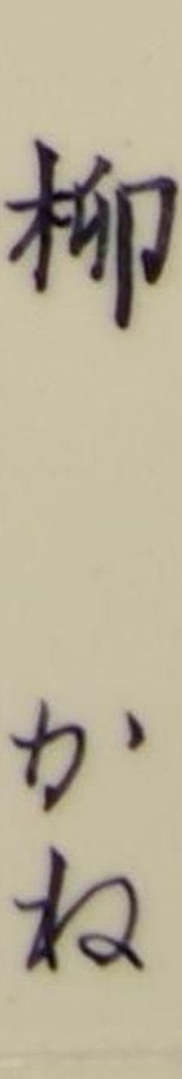柳かね
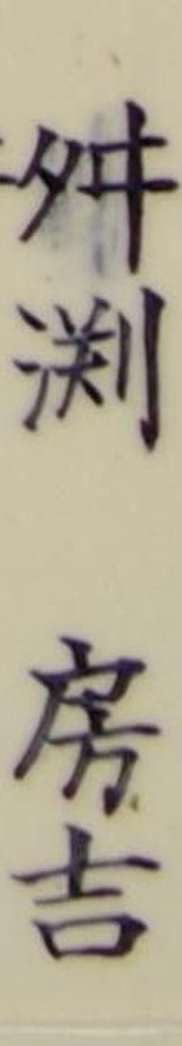舛渕房吉
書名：A~D
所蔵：koyasan kongobuji
